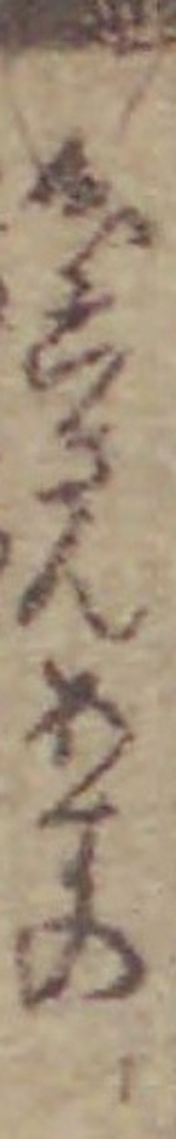介六さんあすの
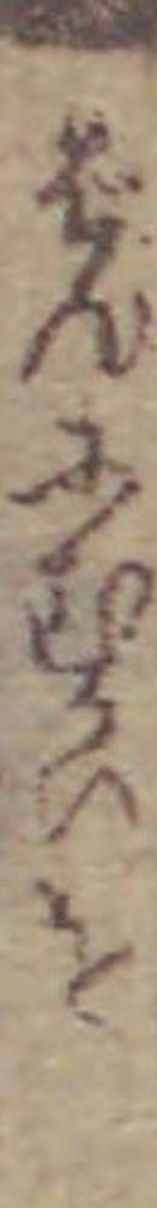ばんにむかいを
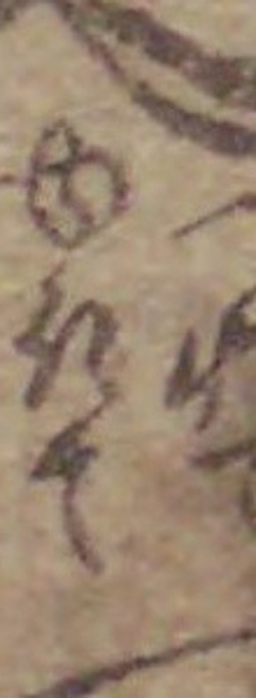ゆきて
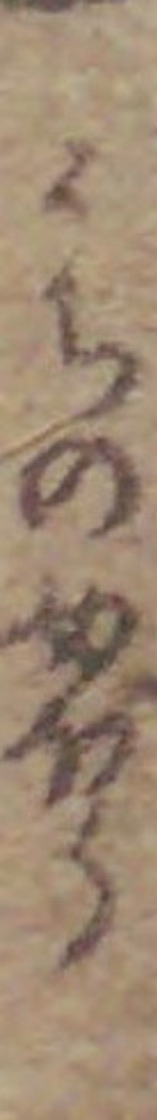うちの女ほう
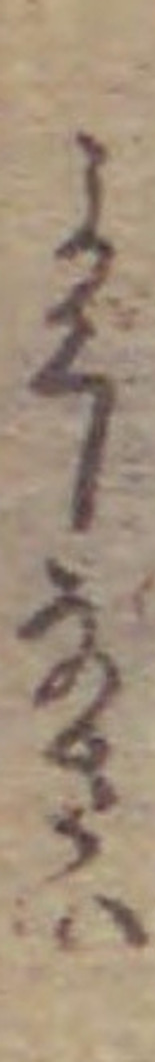よこしなさい

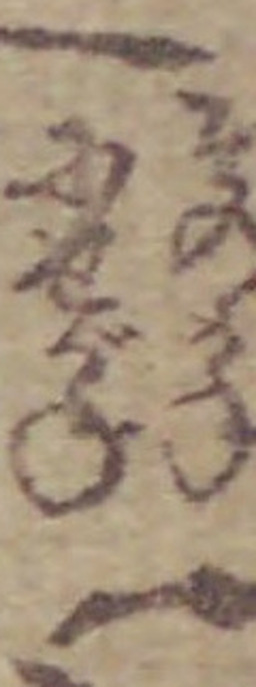にせがね
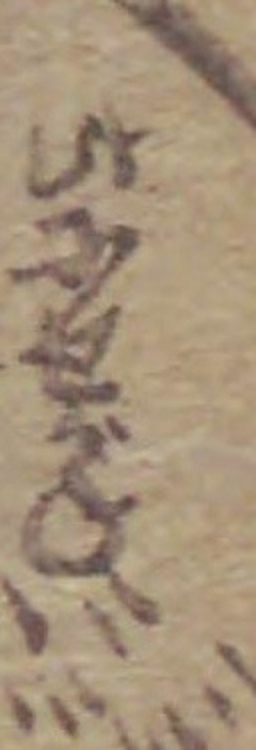此にせがね
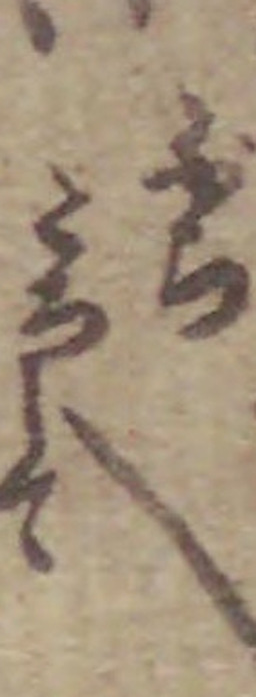ころして
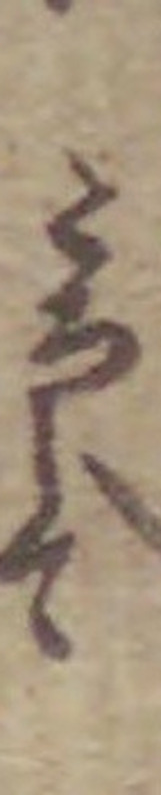ころして
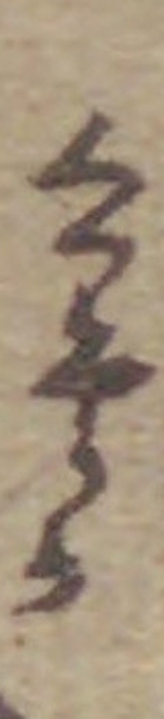くりやうか
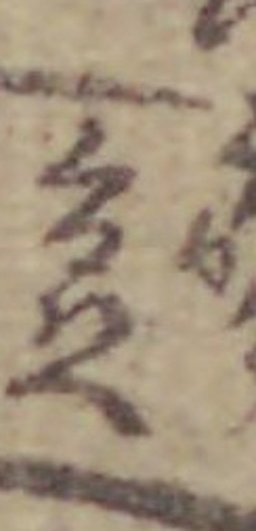くるはへ
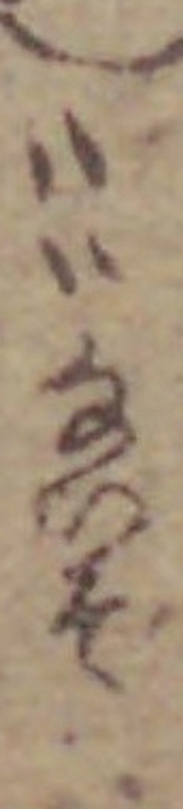ないぞ
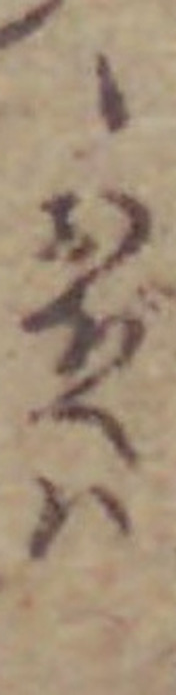おぼへは
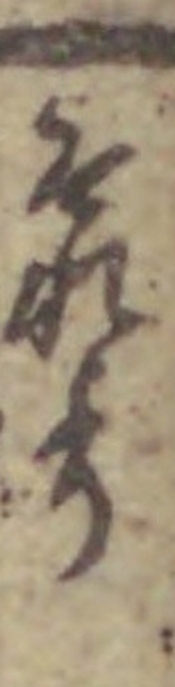それより
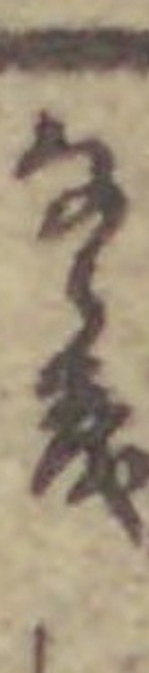なら茂
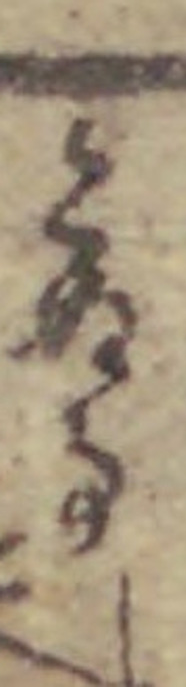こぬ事
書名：大通其面影 2巻
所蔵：国立国会図書館 National Diet Library, JAPAN
